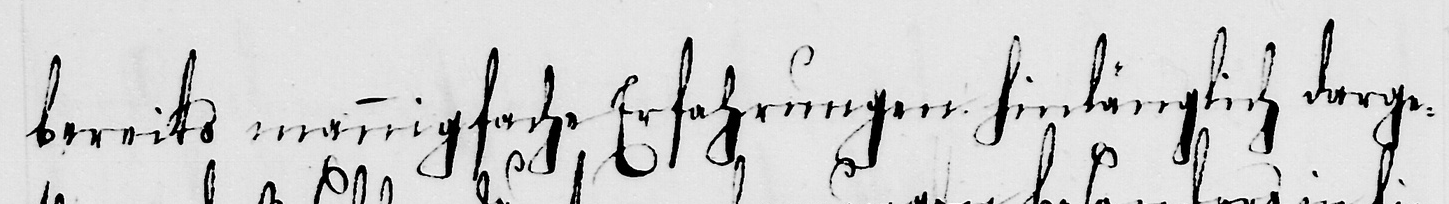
bereits mannigfache Erfahrungen hinlänglich darge¬
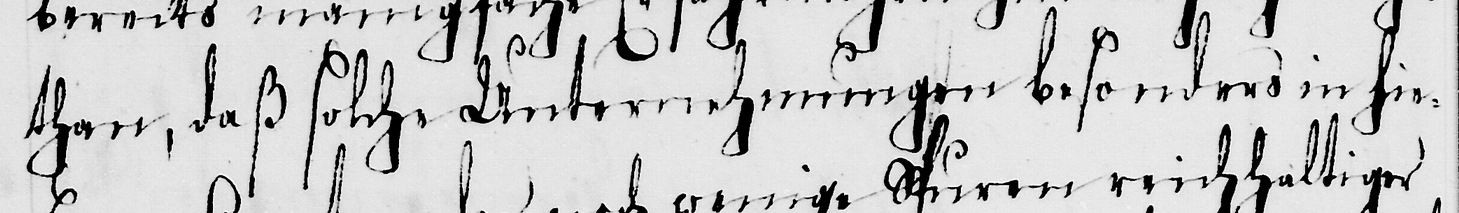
than, daß solche Unternehmungen besonders in hie¬
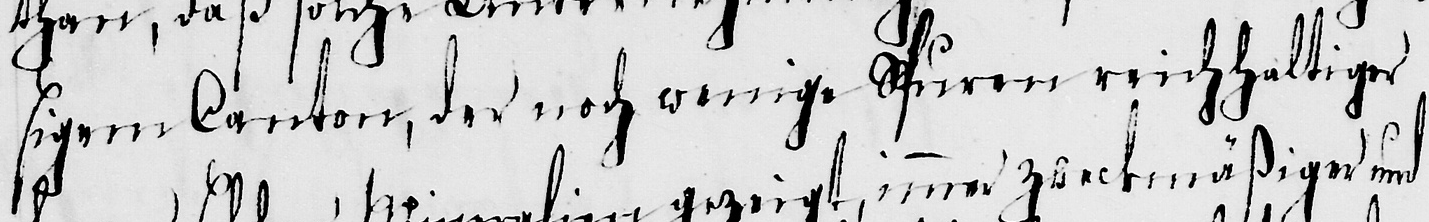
sigem Canton, der noch wenige Spuren reichhaltiger
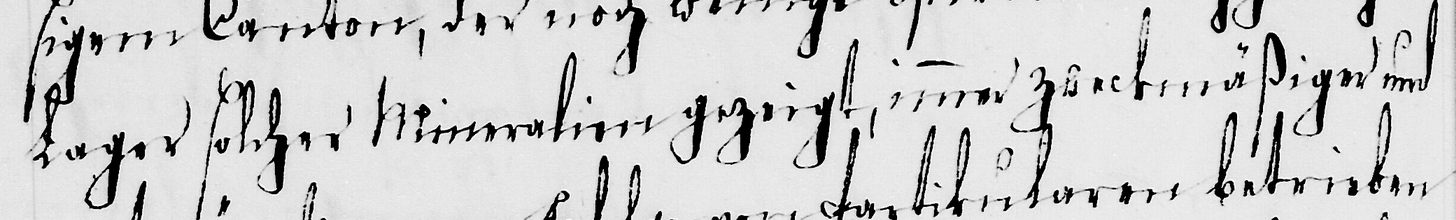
Lager solcher Mineralien gezeigt, immer zweckmäßiger und
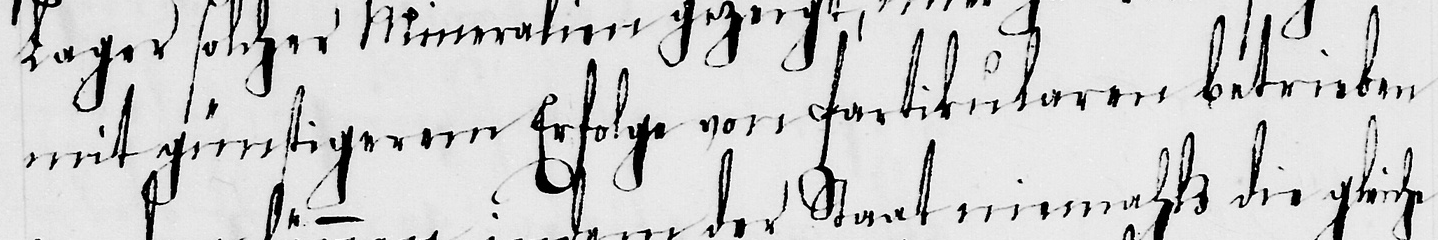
mit günstigerem Erfolge von Partikularen betrieben
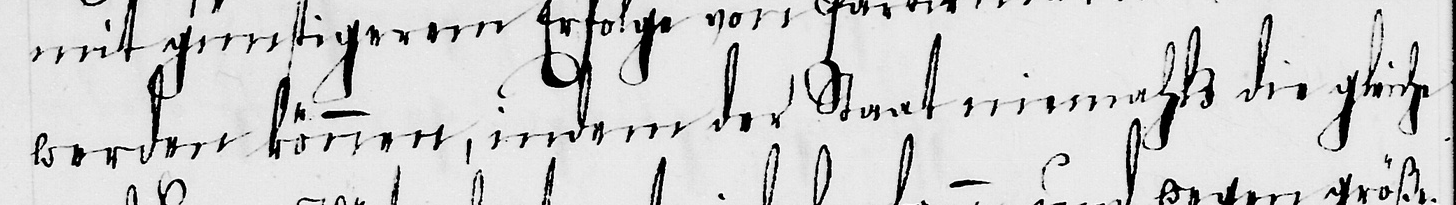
werden können, indem der Staat niemahls die gleiche
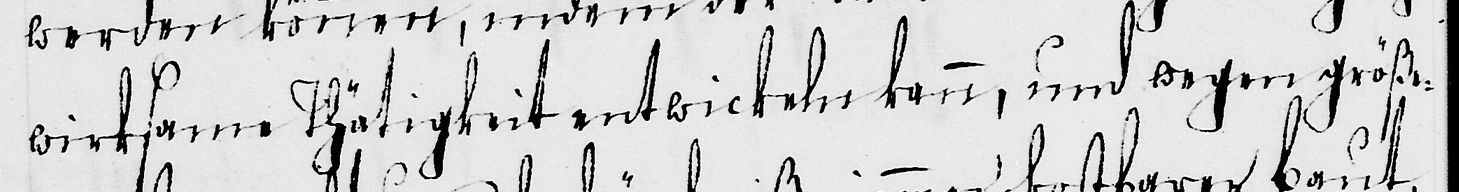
wirksame Thätigkeit entwickeln kann, und wegen größe¬
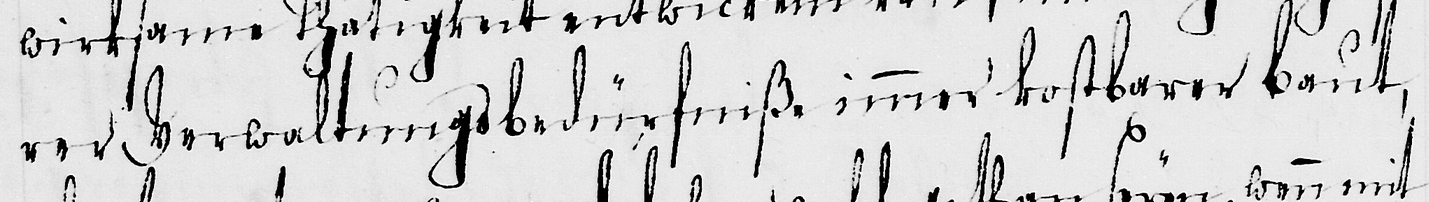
rer Verwaltungsbedürfniße immer kostbarer baut,
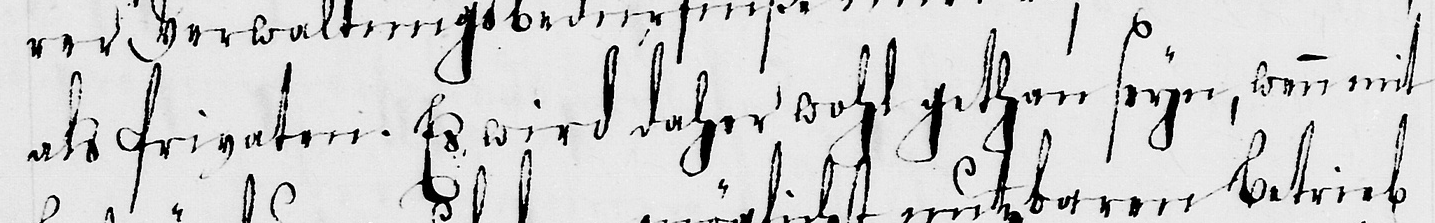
als Privaten. Es wird daher wohl gethan seyn, wenn mit
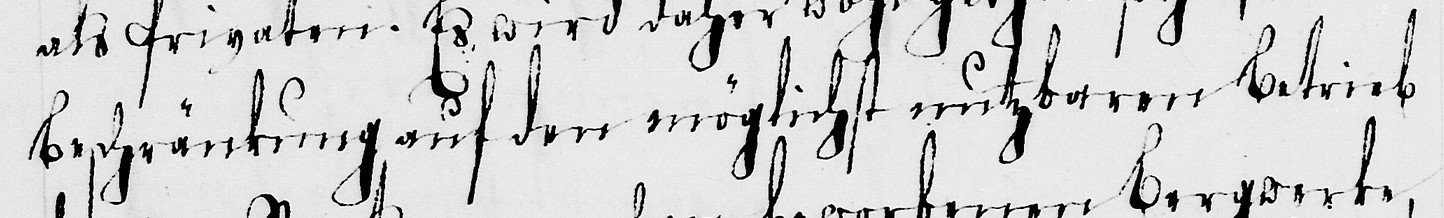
Beschränkung auf den möglichst nutzbaren Betrieb
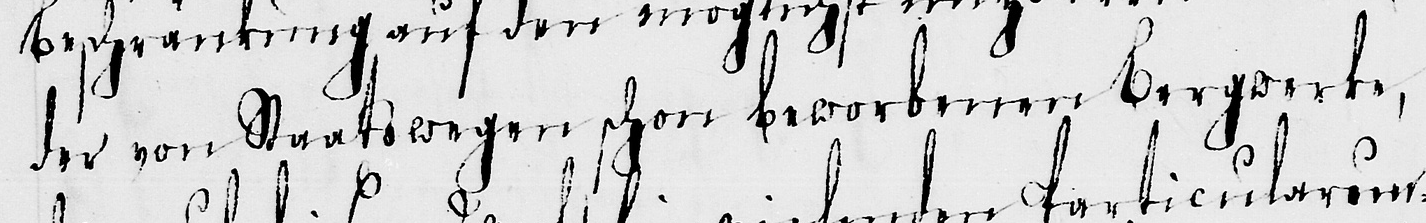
der von Staatswegen schon beworbenen Bergwerke,
